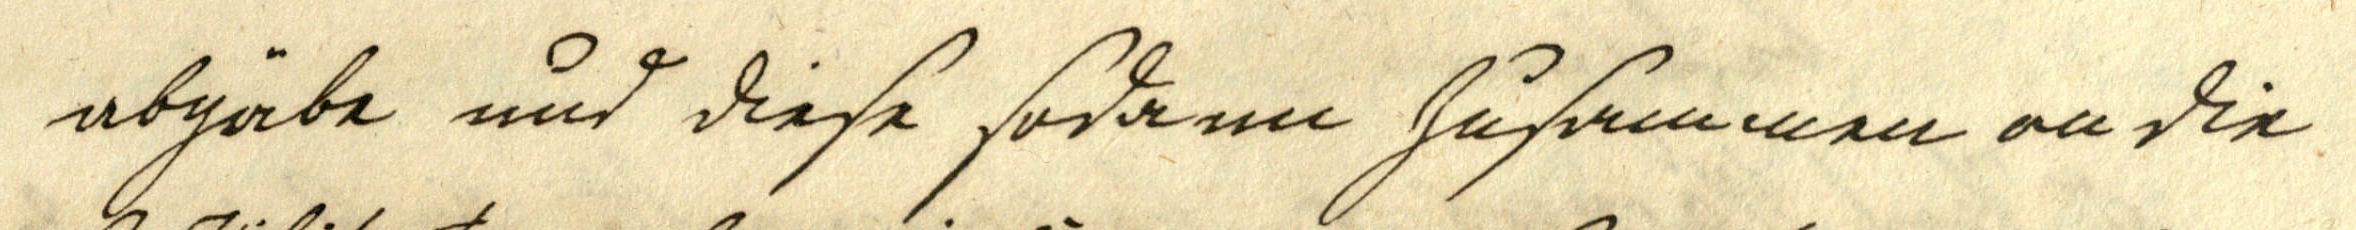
abgäbe und diese sodann zusammen an die
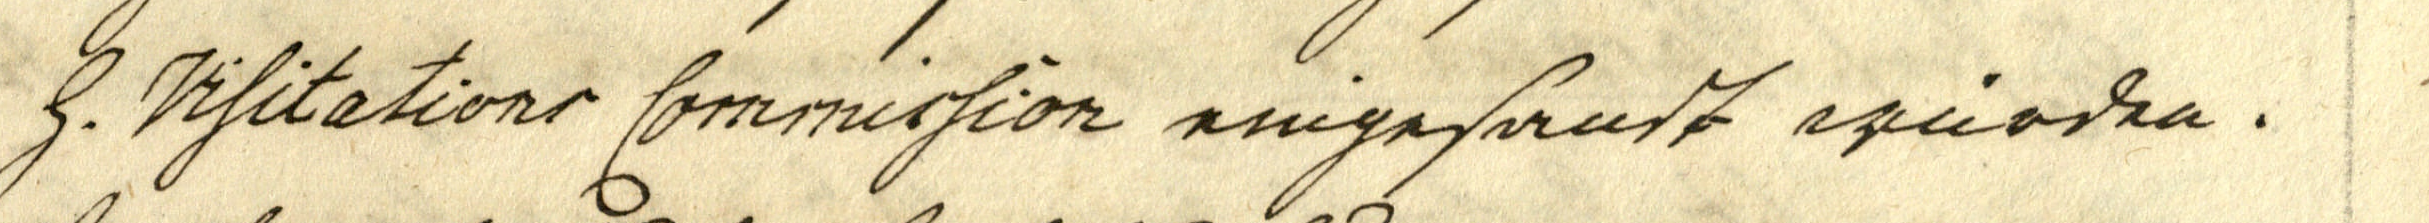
h. Visitations Commission eingesandt würde.
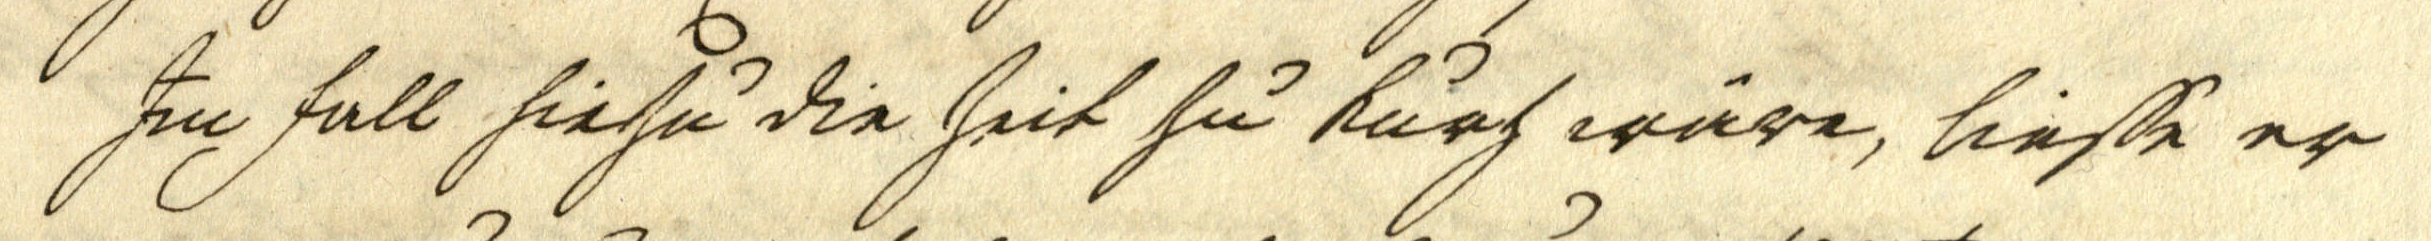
Im Fall hiezu die Zeit zu kurz wäre, liesse er
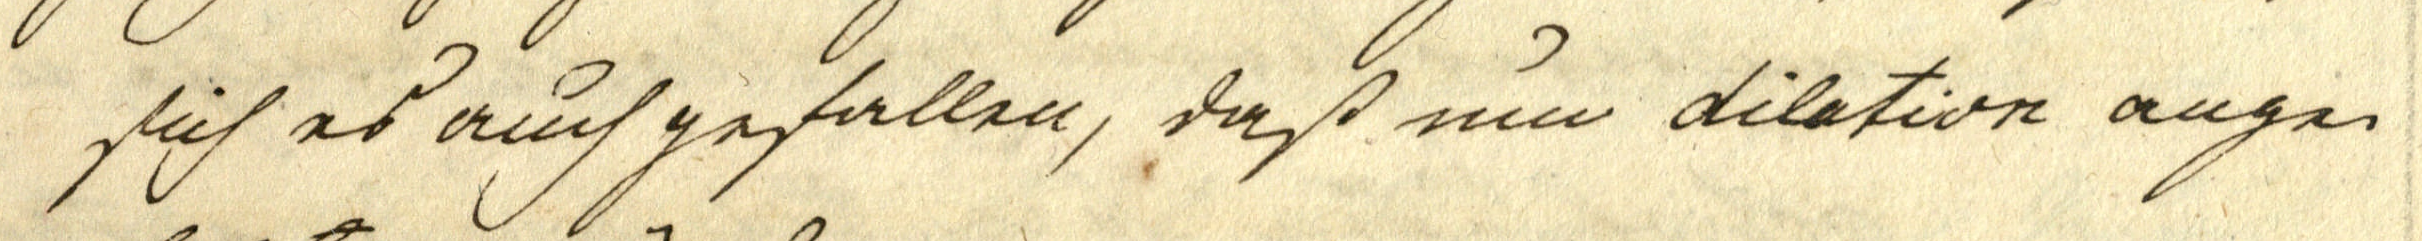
sich es auch gefallen, daß um dilation ange-
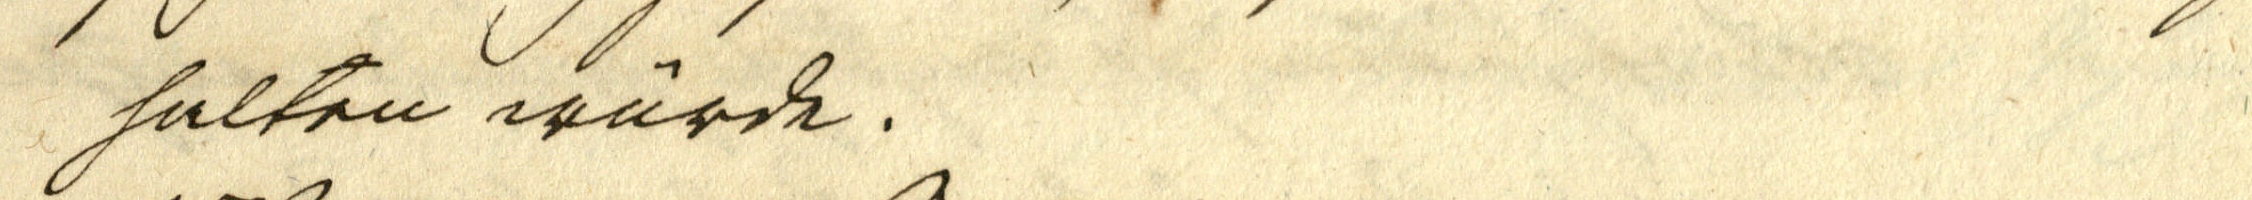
halten würde.
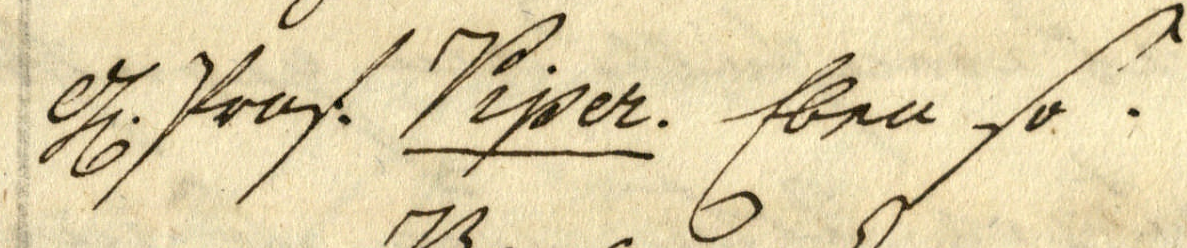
dh. Prof. Piper. Eben so.
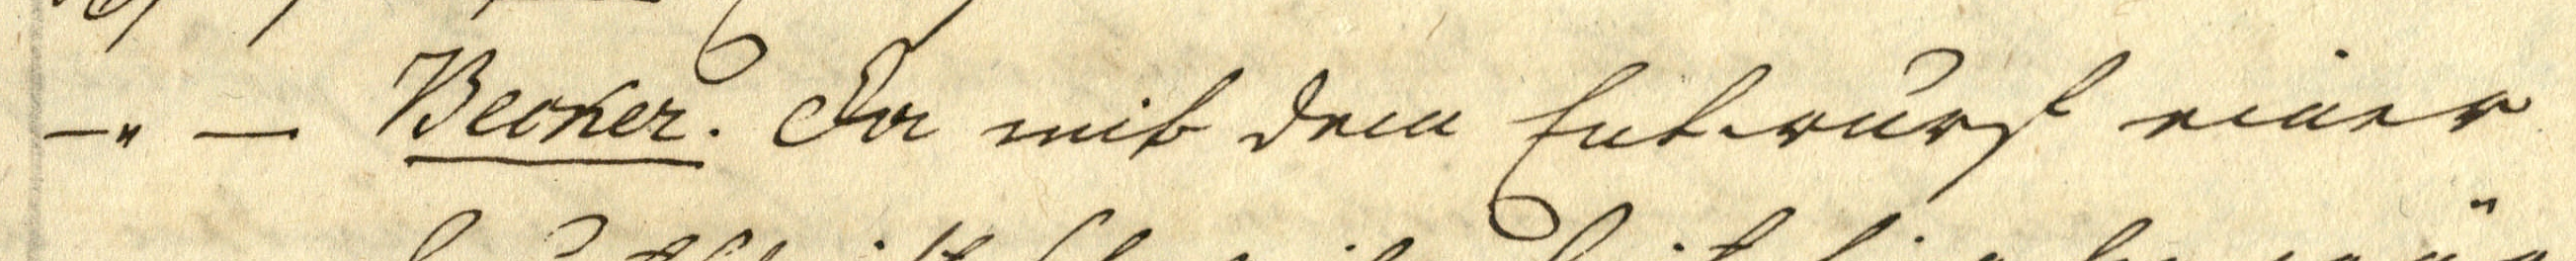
- " - Becker. Da mit dem Entwurf einer
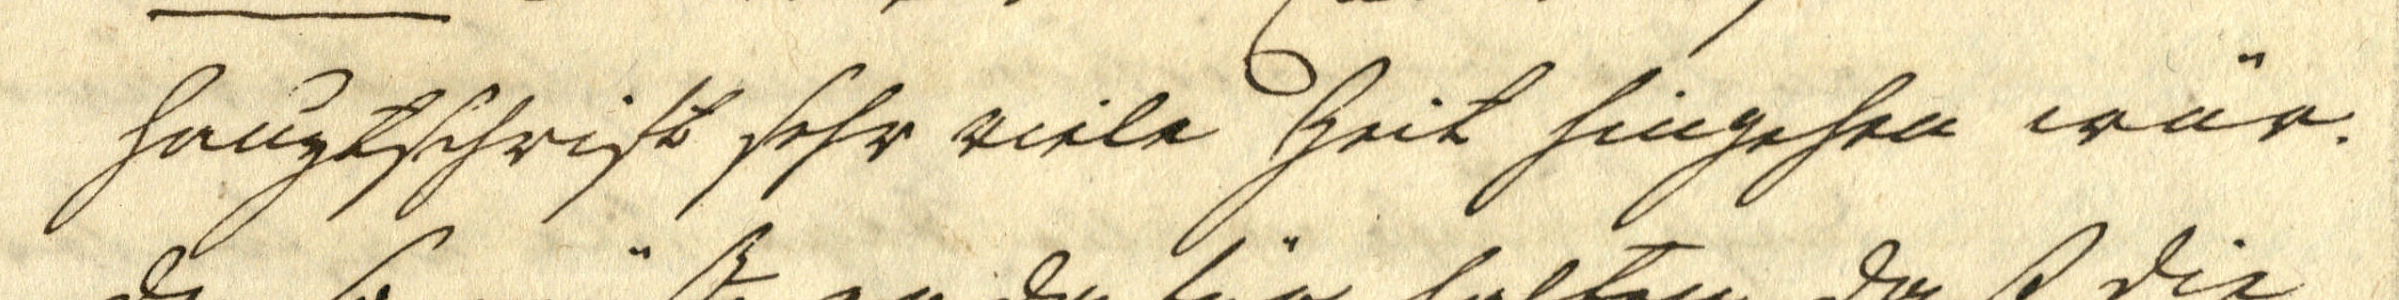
Hauptschrift sehr viele Zeit hingehen wür-
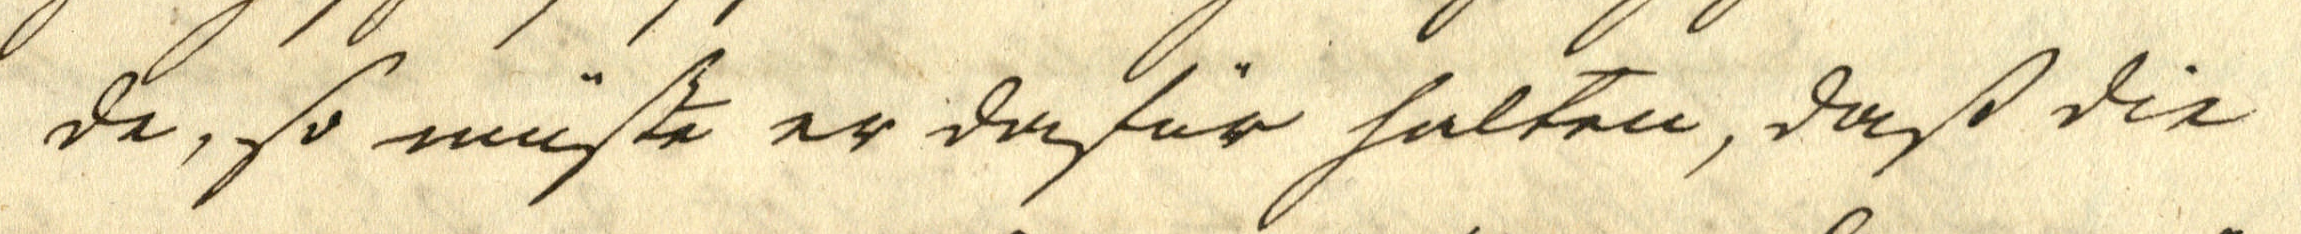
de, so müßte er dafür halten, daß die
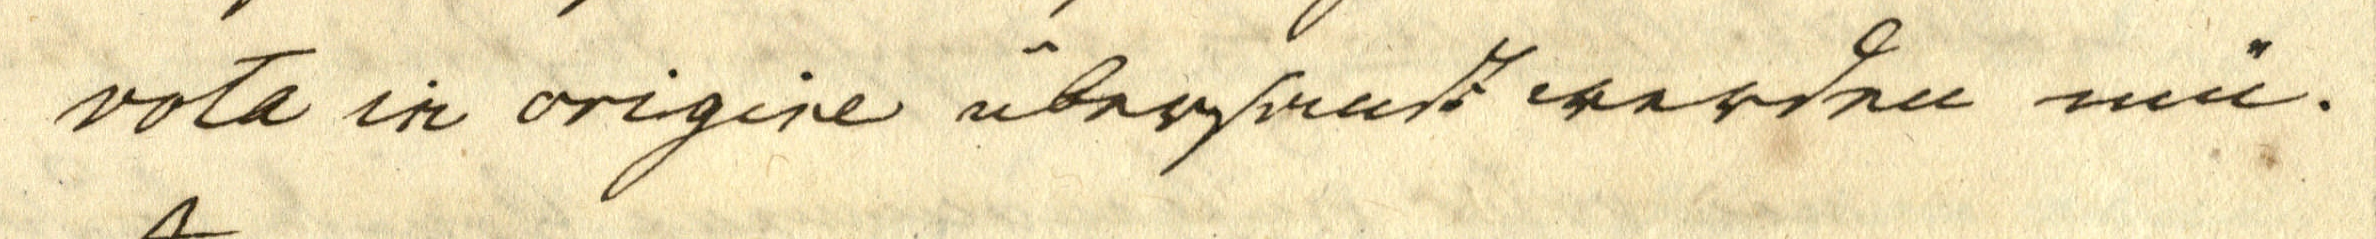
vota in origine übersandt werden mü-
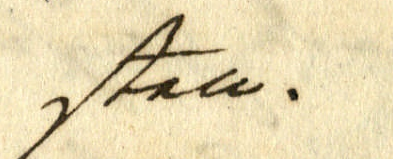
ßten.
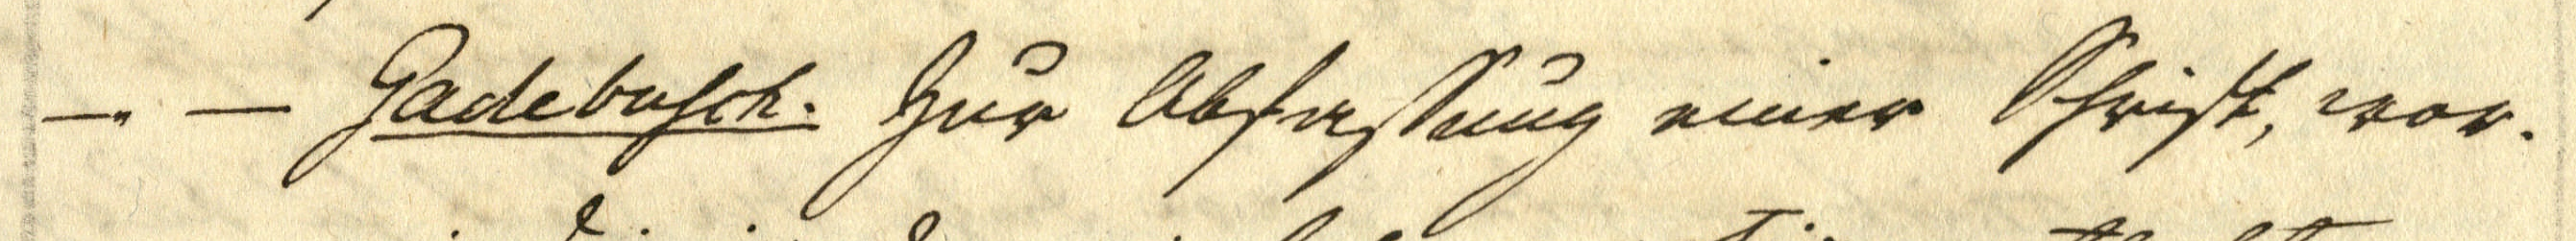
- " - Gadebusch. Zur Abfassung einer Schrift, wor-
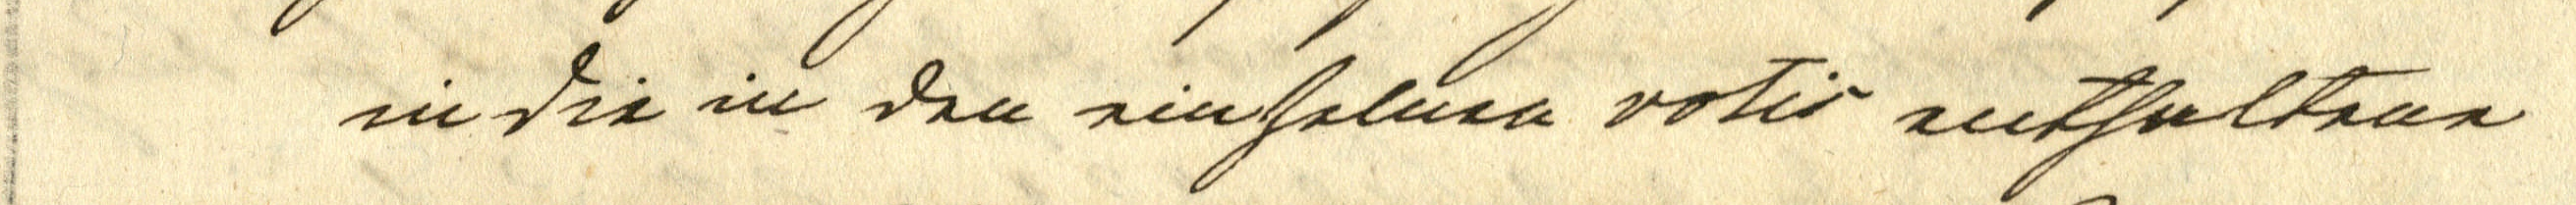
in die in den einzelnen votis enthaltene
